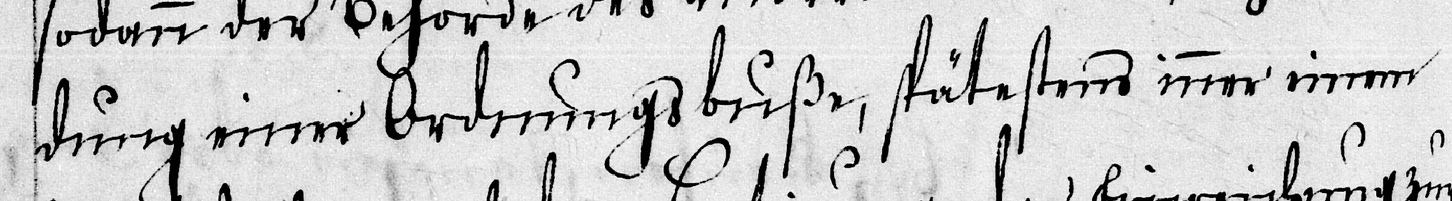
dung einer Ordnungsbuße, spätestens immer einem
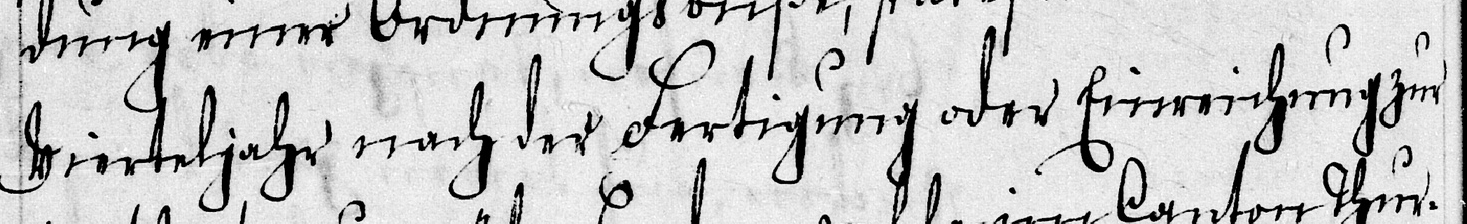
Vierteljahr nach der Fertigung oder Einreichung zur
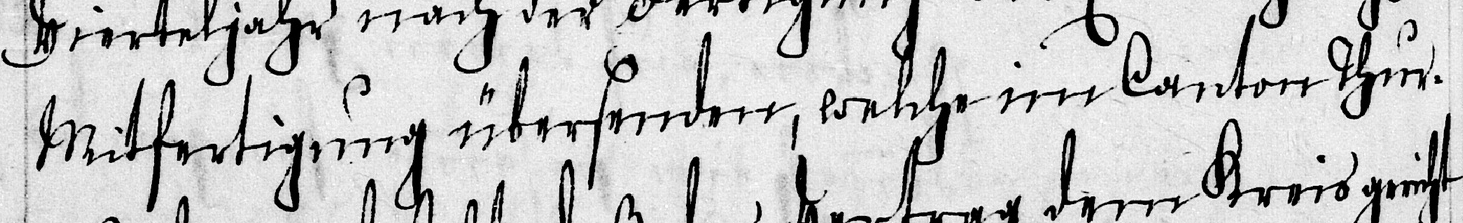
Mitfertigung übersenden, welche im Canton Thur¬
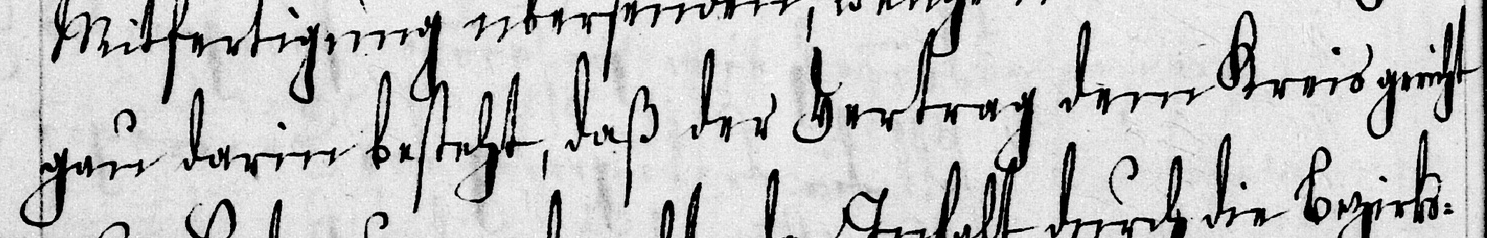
gau darin besteht, daß der Vertrag dem Kreisger¬
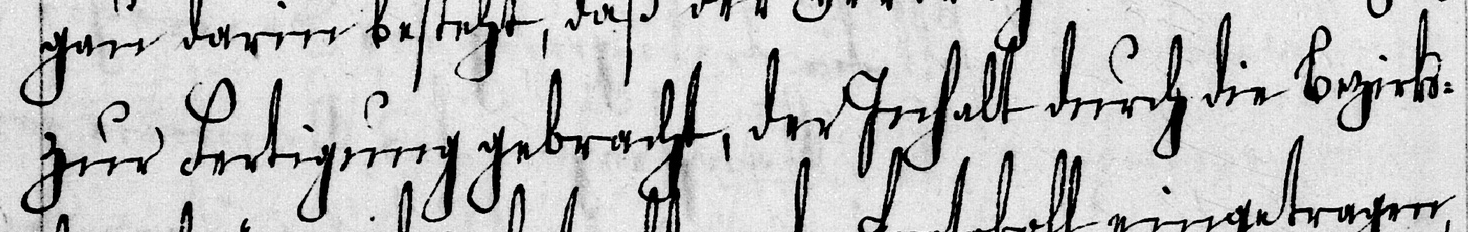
zur Fertigung gebracht, der Inhalt durch die Bezirk¬
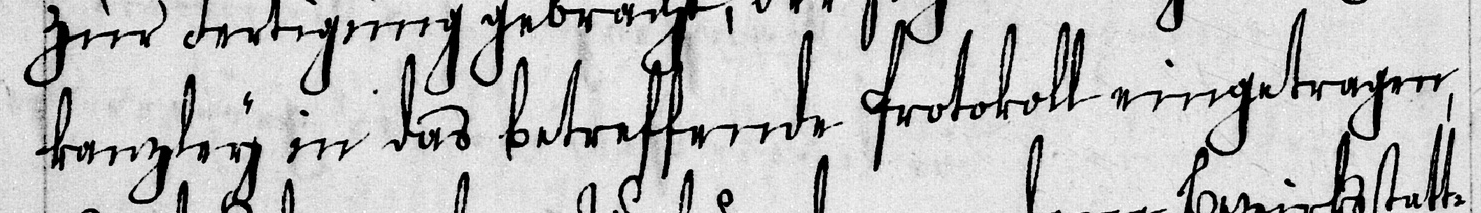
skanzley in das betreffende Protokoll eingetragen,
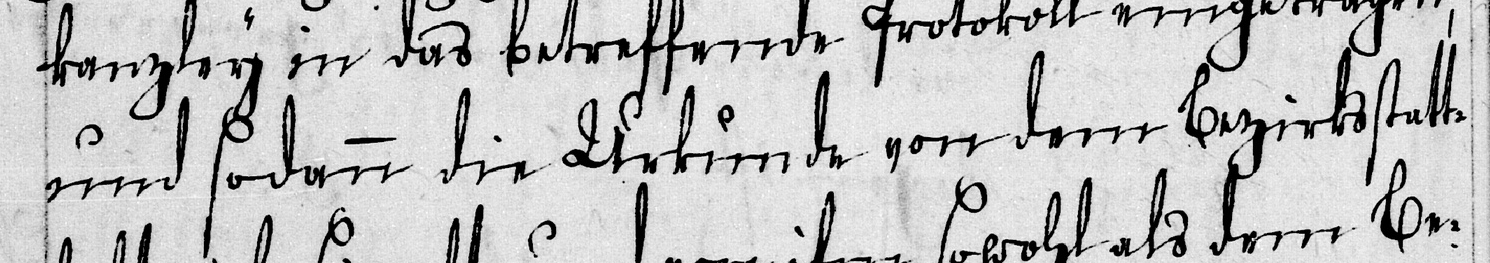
und sodann die Urkunde von dem Bezirksstat¬
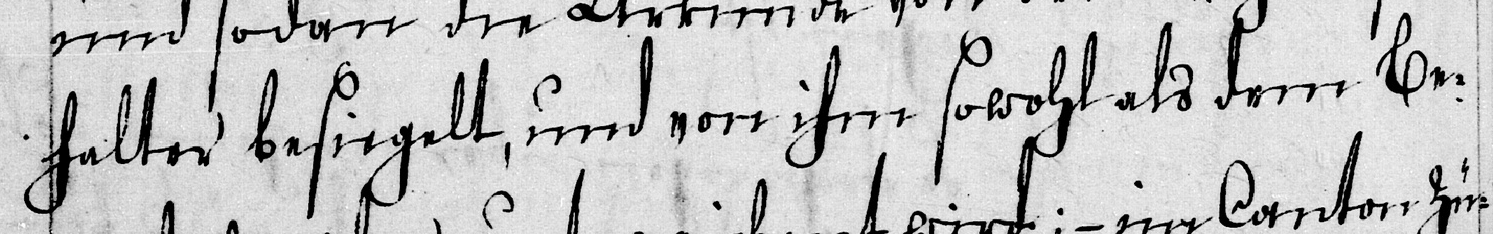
thalter besiegelt, und von ihm sowohl als dem Be¬
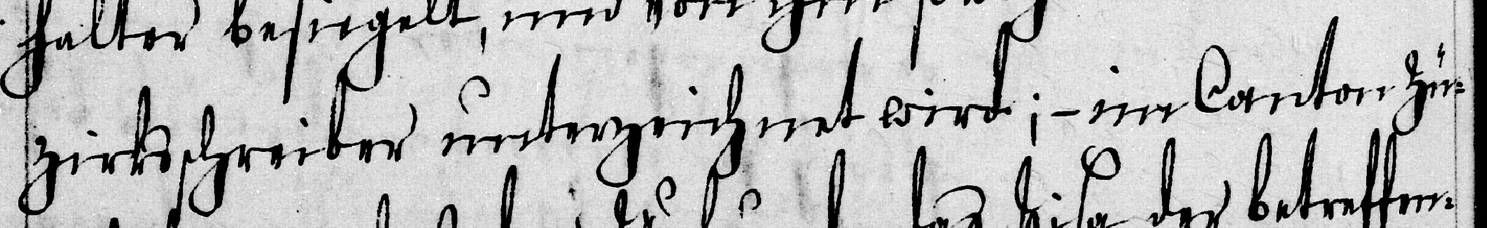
zirksschreiber unterzeichnet wird; – im Canton Zü¬
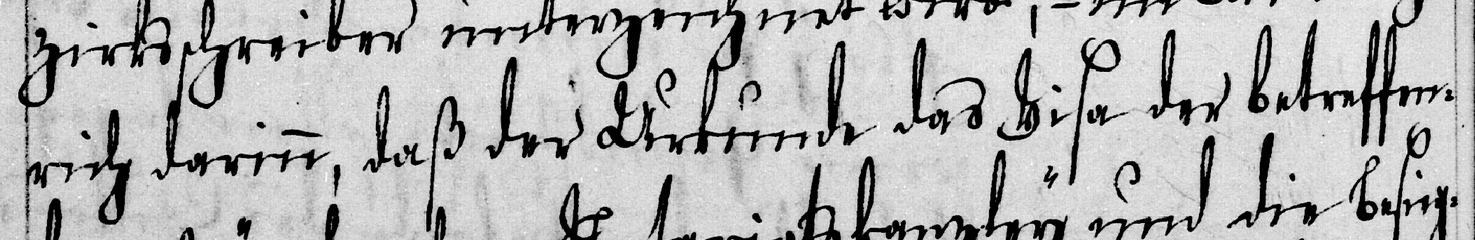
rich darinn, daß der Urkunde das Visa der betreffe¬
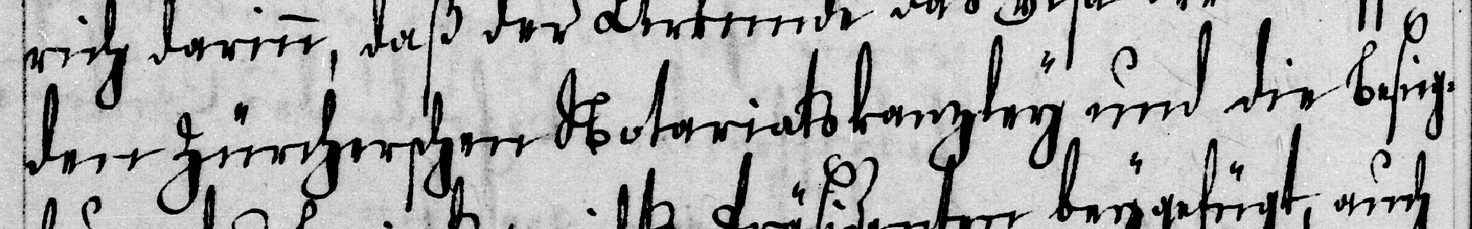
nden Zürcherschen Notariatskanzley und die Besie¬
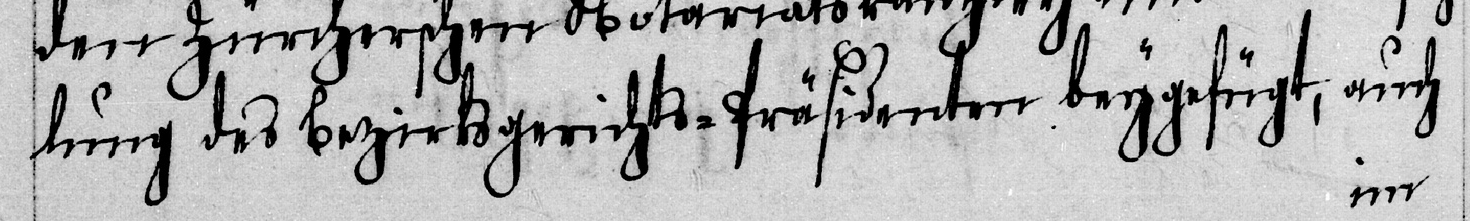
glung des Bezirksgerichts-Präsidenten beygefügt, auch
